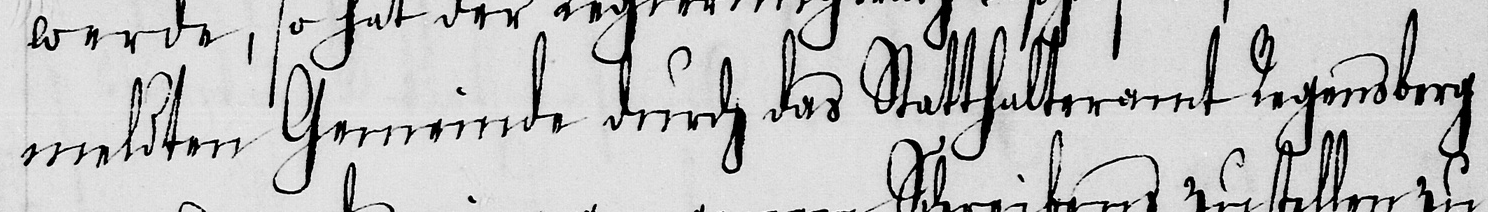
meldten Gemeinde durch das Statthalteramt Regensberg
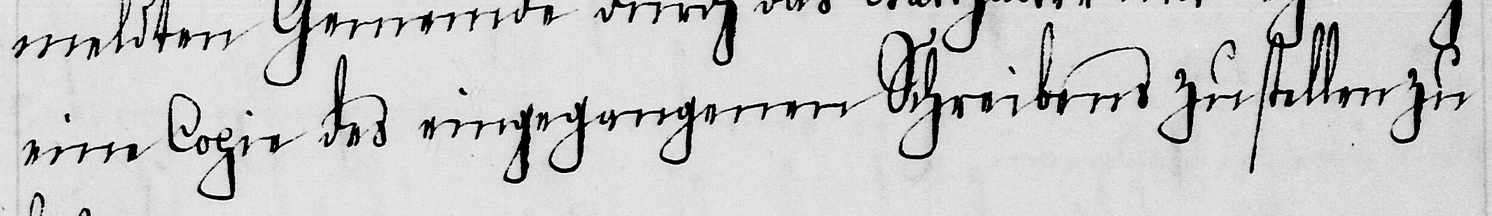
eine Copie des eingegangenen Schreibens zustellen zu
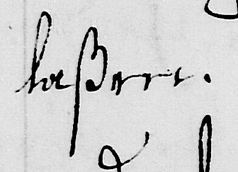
laßen.
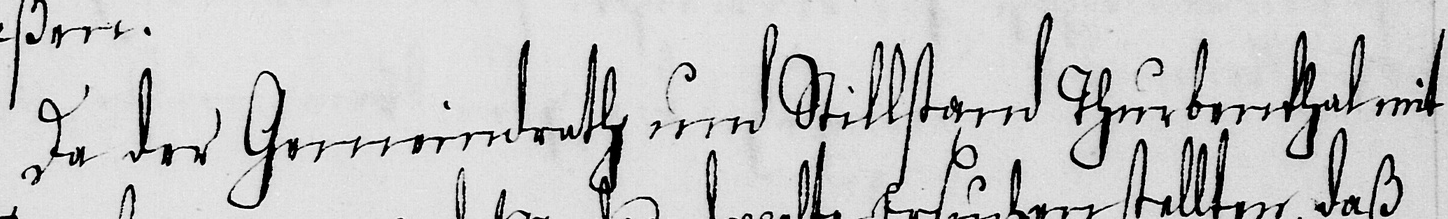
Da der Gemeindrath und Stillstand Thurbenthal mit
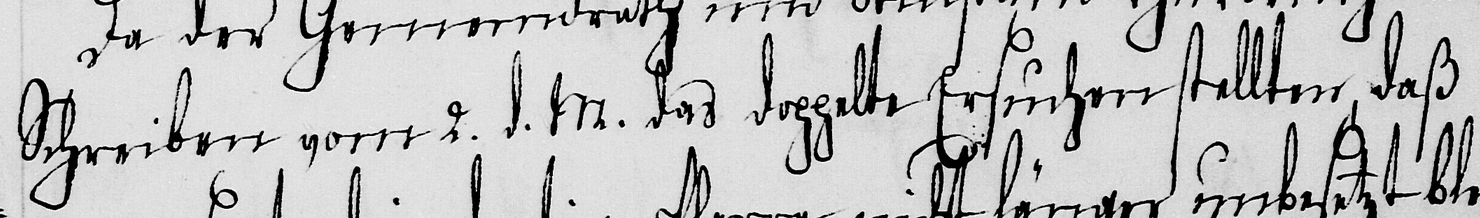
Schreiben vom 2. d. M. das doppelte Ersuchen stellten, daß
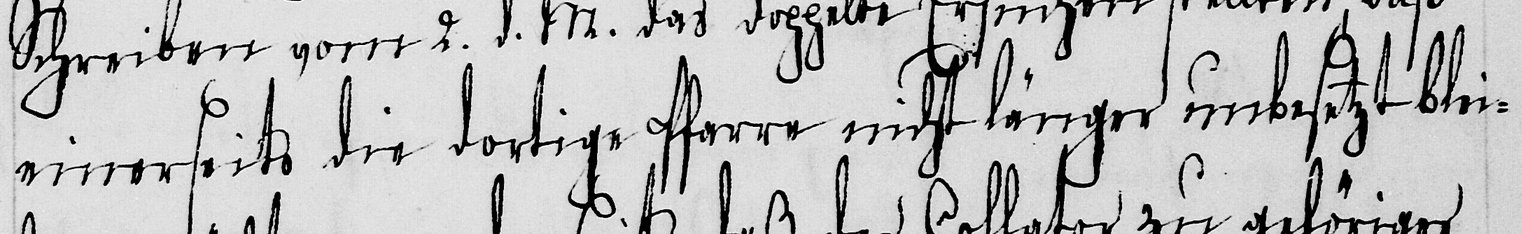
einerseits die dortige Pfarre nicht länger unbesetzt b¬
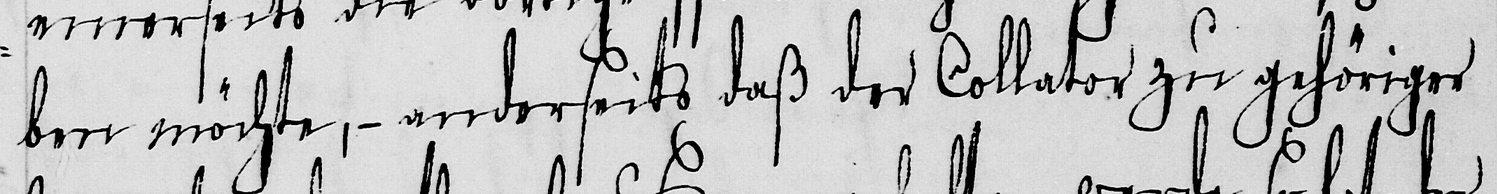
ben möchte, – anderseits daß der Collator zu gehöriger
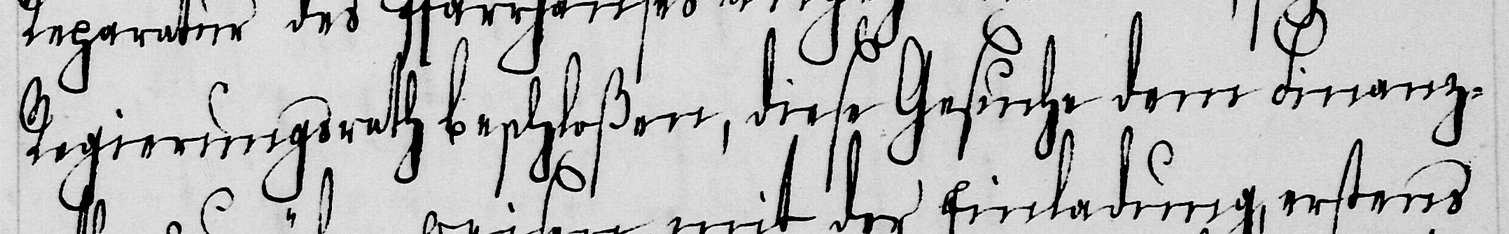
Regierungsrath beschloßen, diese Gesuche dem Finanz¬
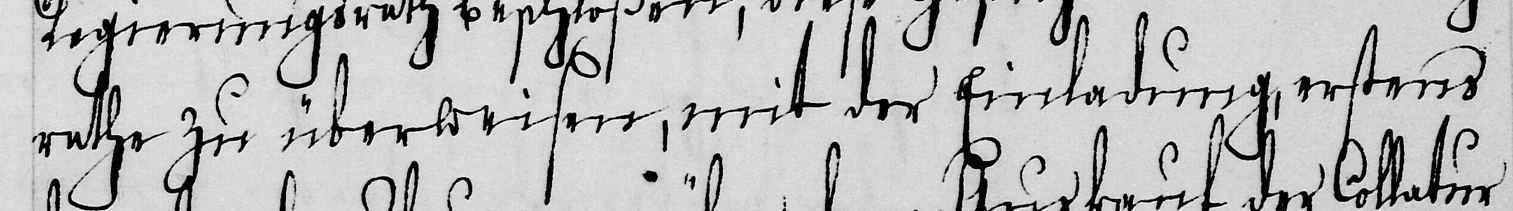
rathe zu überweisen, mit der Einladung, erstens
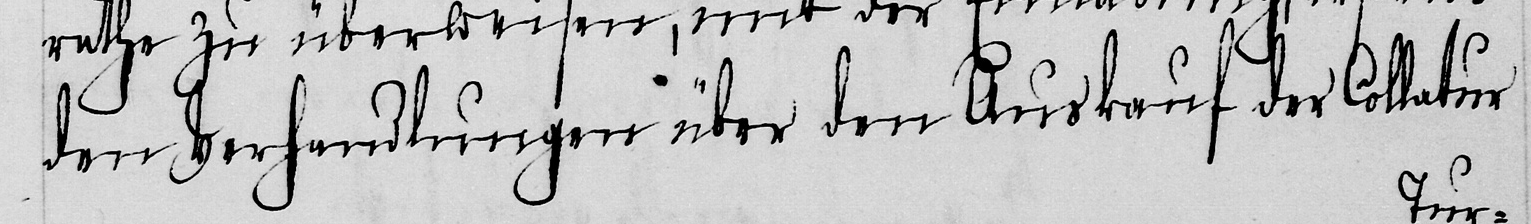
den Verhandlungen über den Auskauf der Collatur
